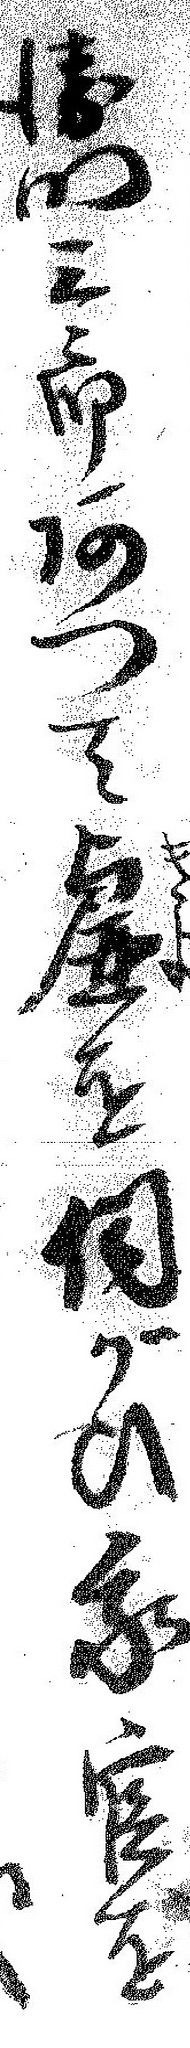衛門三郎あつて虚を伺がひ我官を
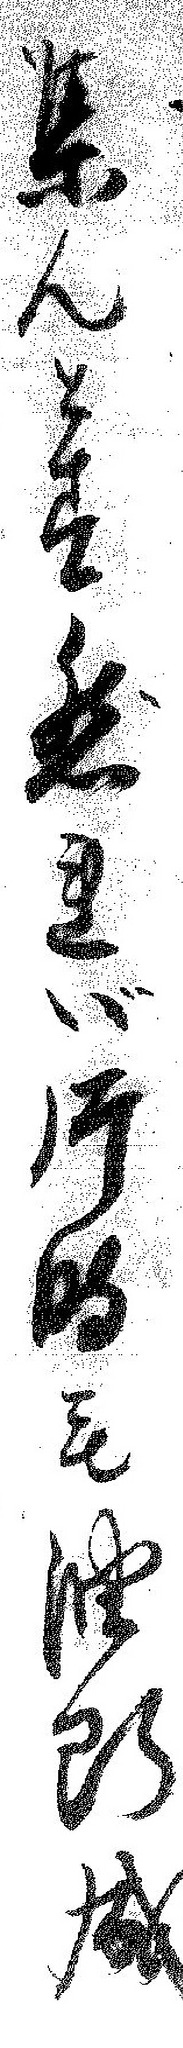集んとす然れば片時も油断成
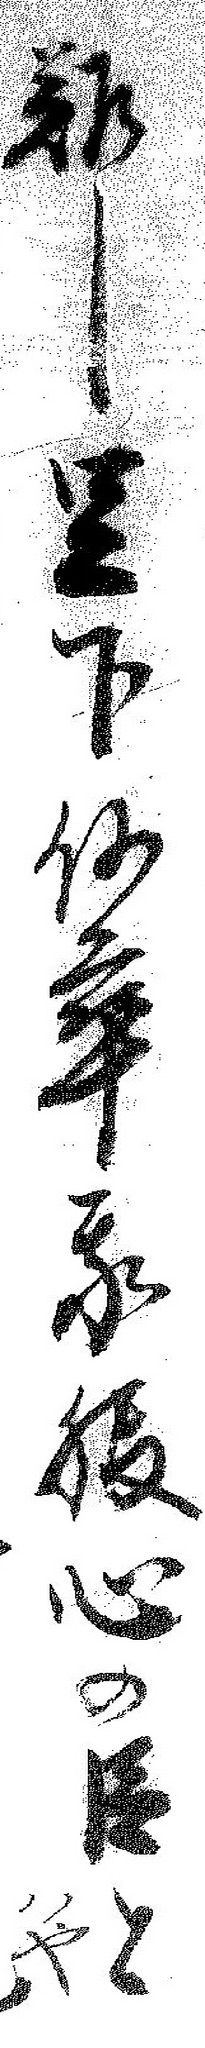難し足下何卒我腹心の臣と
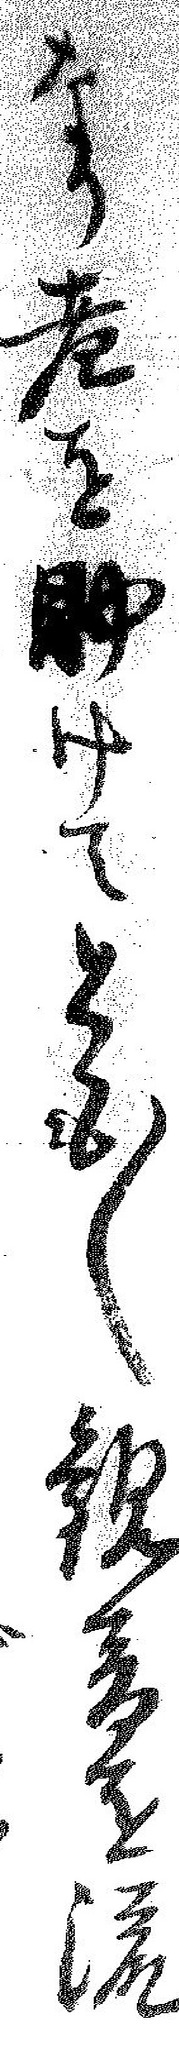なり老を助けてとも〳〵観音を流
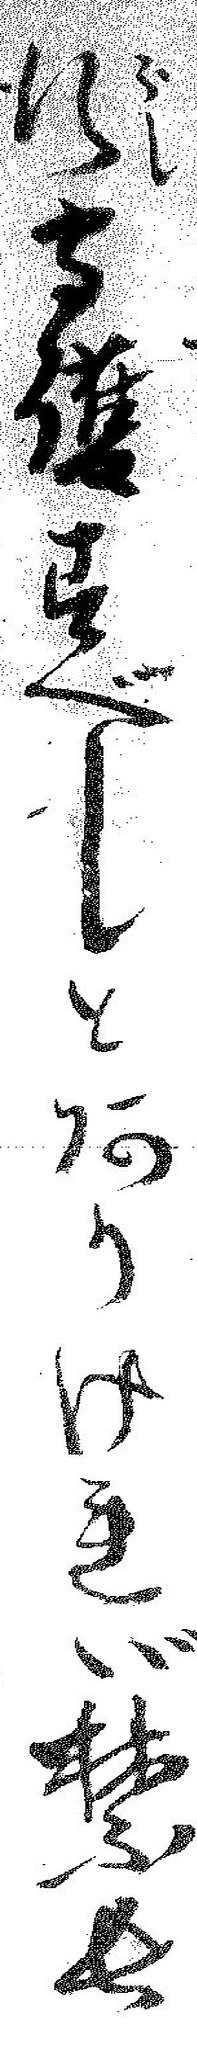行守護すべしとありければ禁長
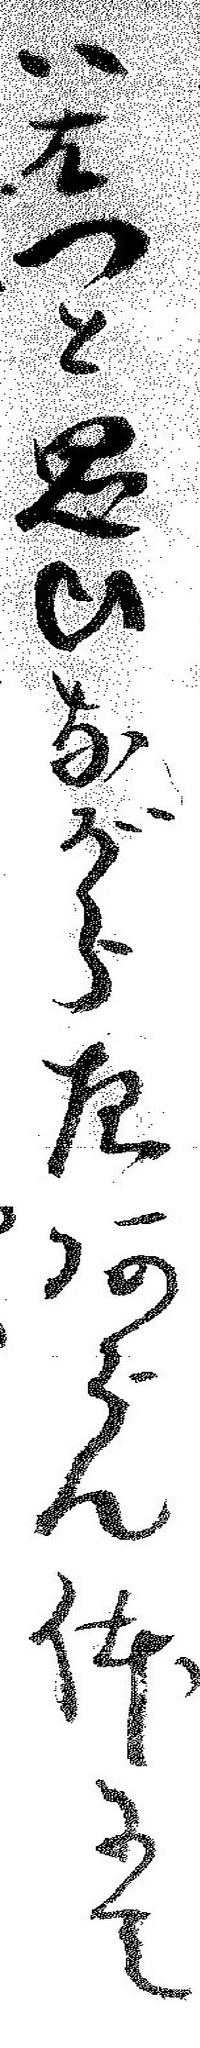ははつと思ひながら左あらん体にて
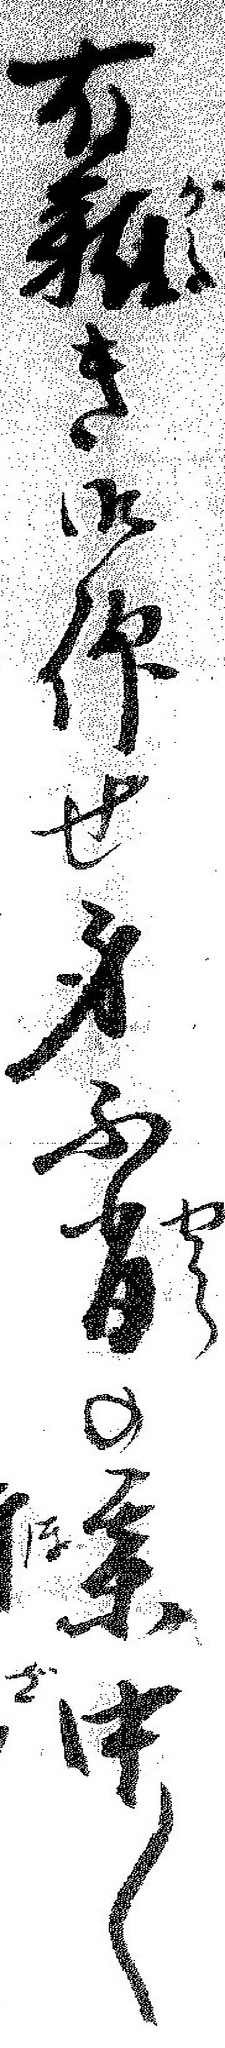有難き御仰せ身不肖の某中〳〵
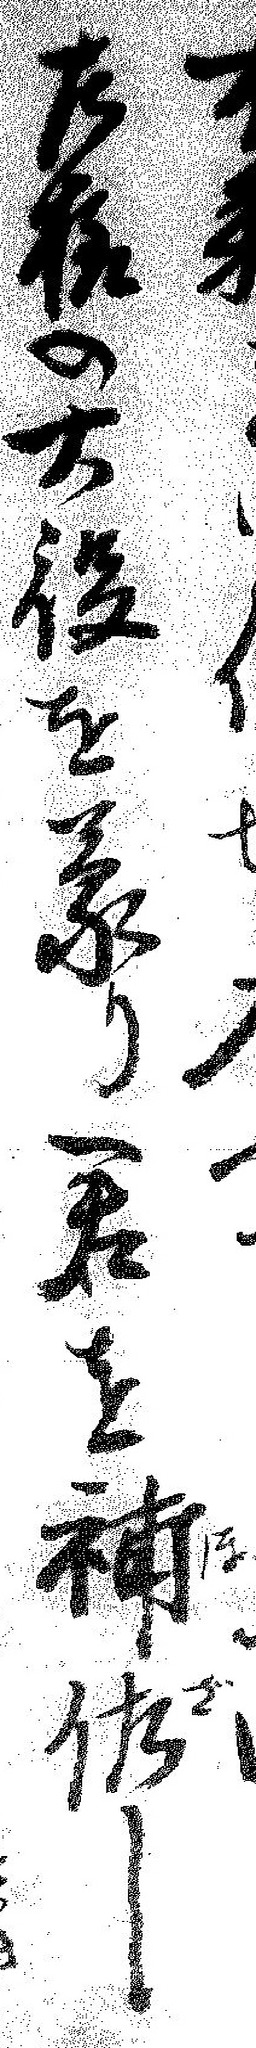左様の大役を蒙り君を補佐し
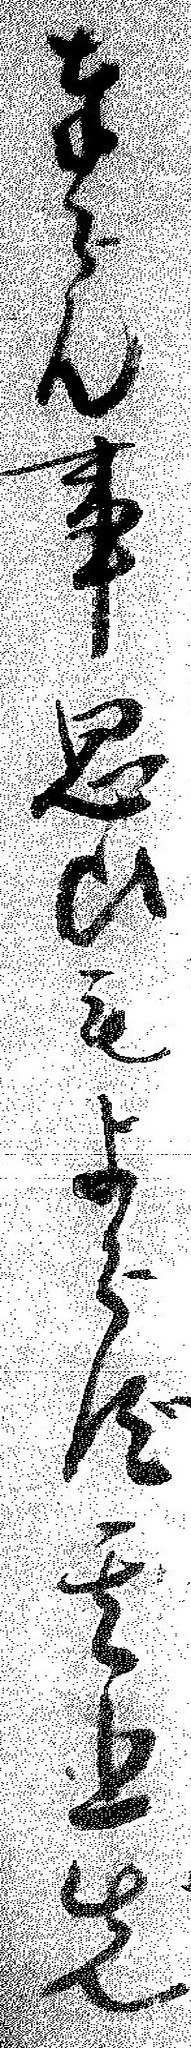奉らん事思ひもよらず其上先

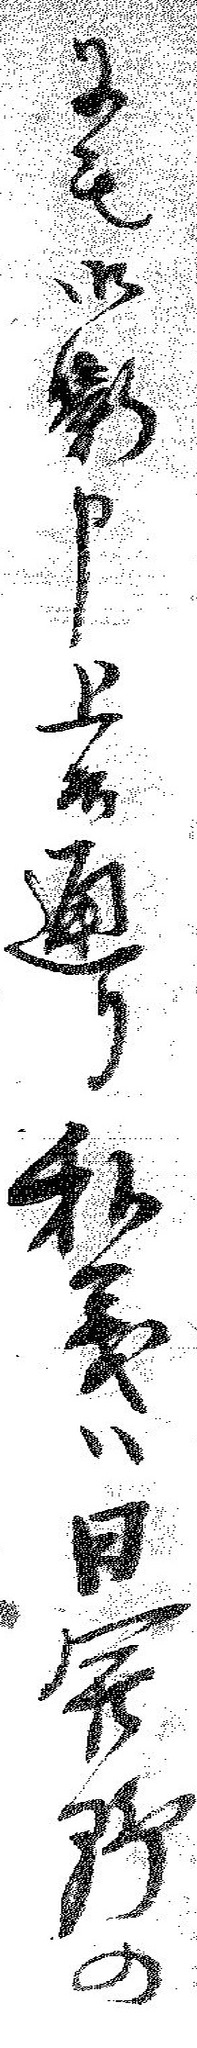にも御噺申上候通り私義は日開野の
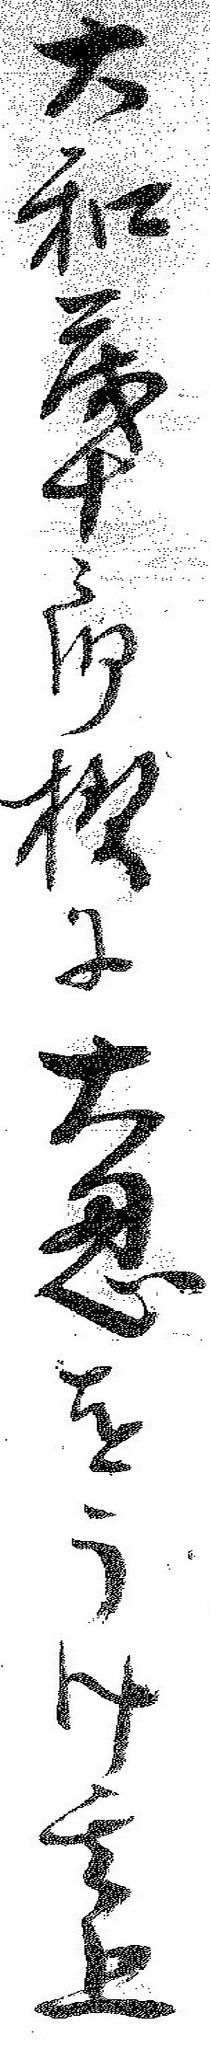大和茂十郎様に大恩をうけ其上
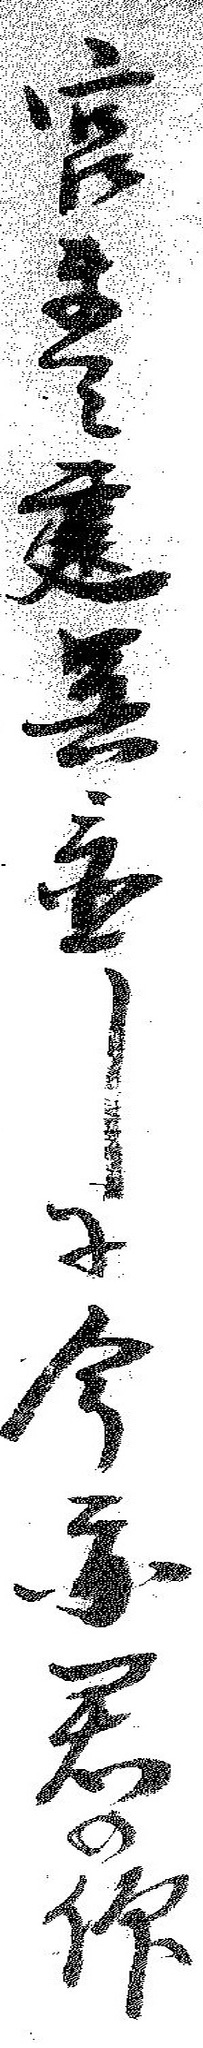宮まて建呉置しに今亦君の仰
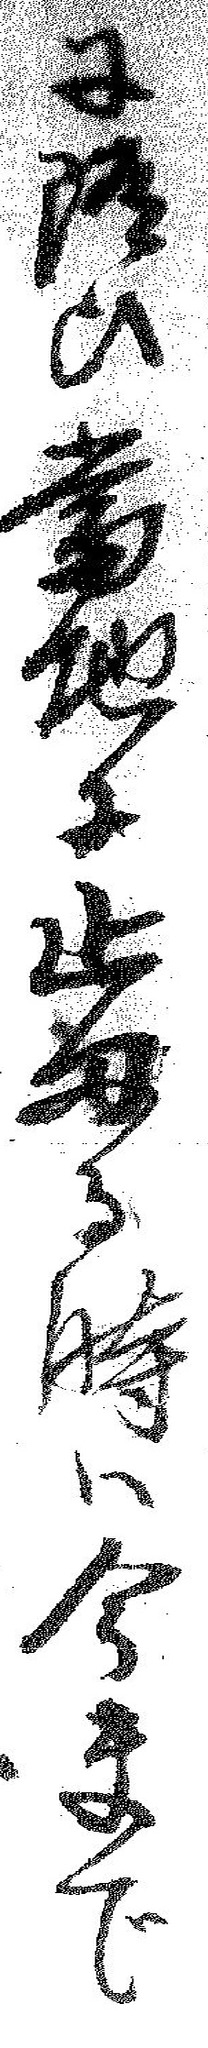に随ひ当地に止まる時は今まで
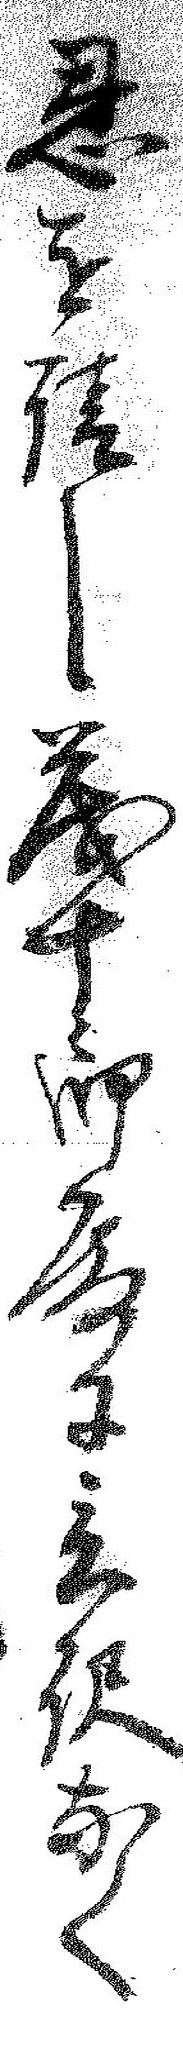恩を請し茂十郎殿に立訳なく
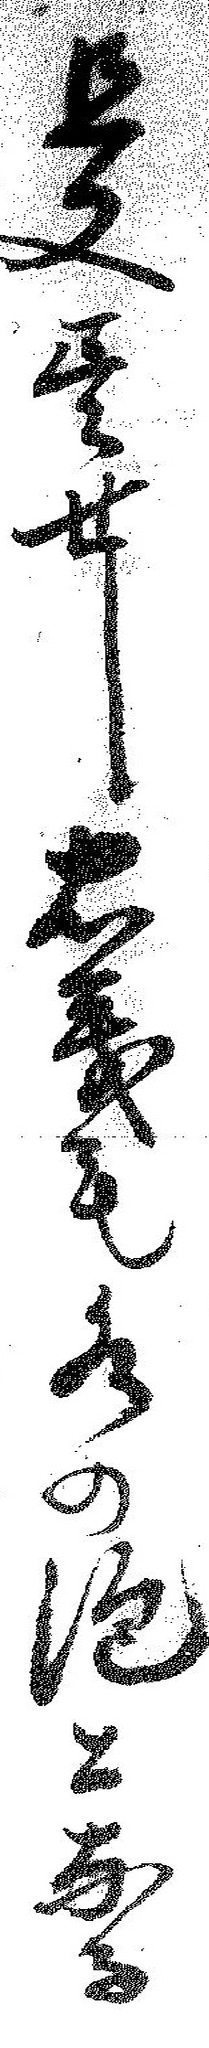且又尽せし忠義も水の泡となる
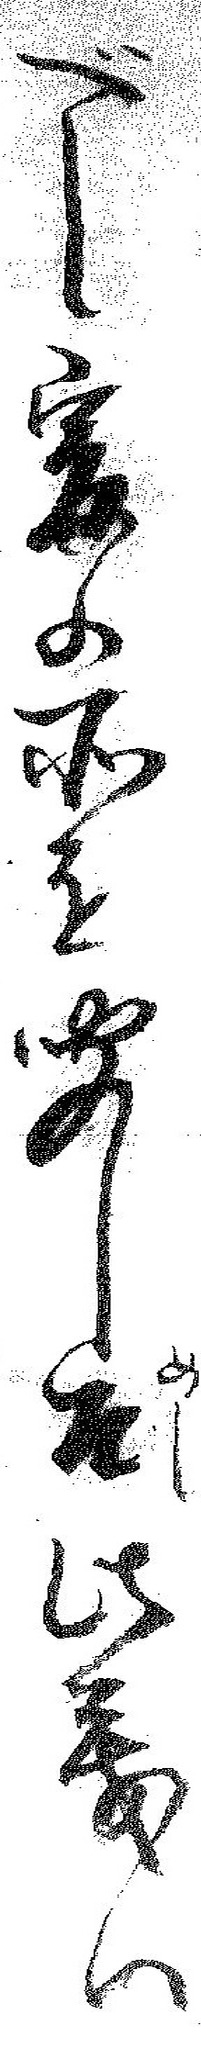べし爰の所を聞し召此義は
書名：近頃古狸珍説　礼義智信
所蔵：徳島県立図書館
